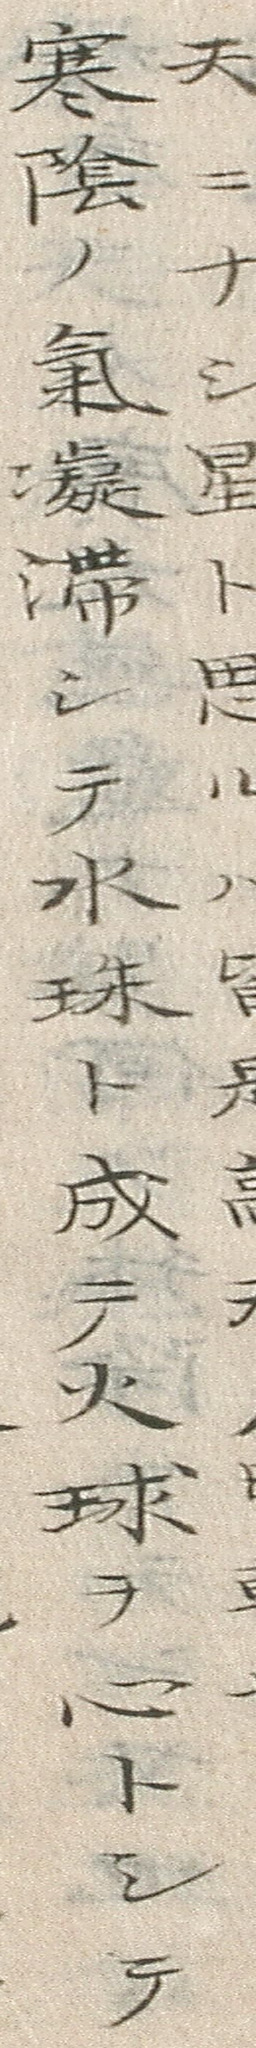寒陰ノ気凝滞シテ水珠ト成テ火球ヲ心トシテ
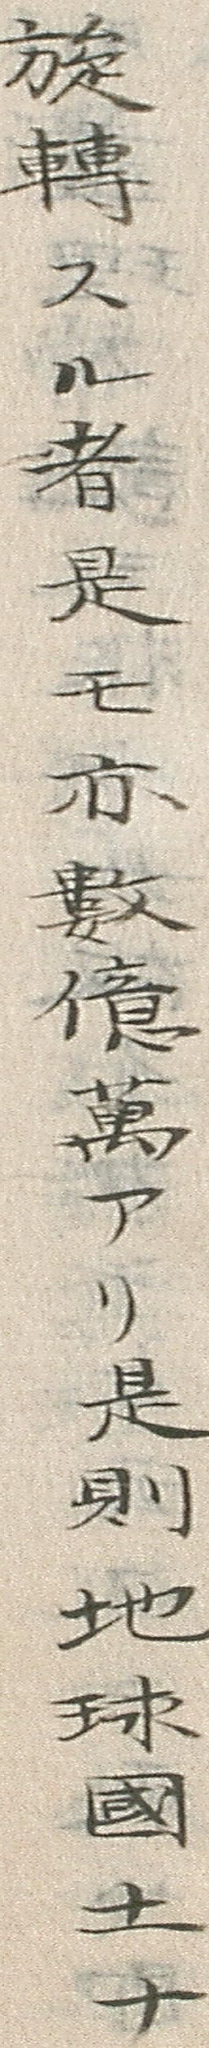旋転スル者是モ亦数億万アリ是則地球国土ナ
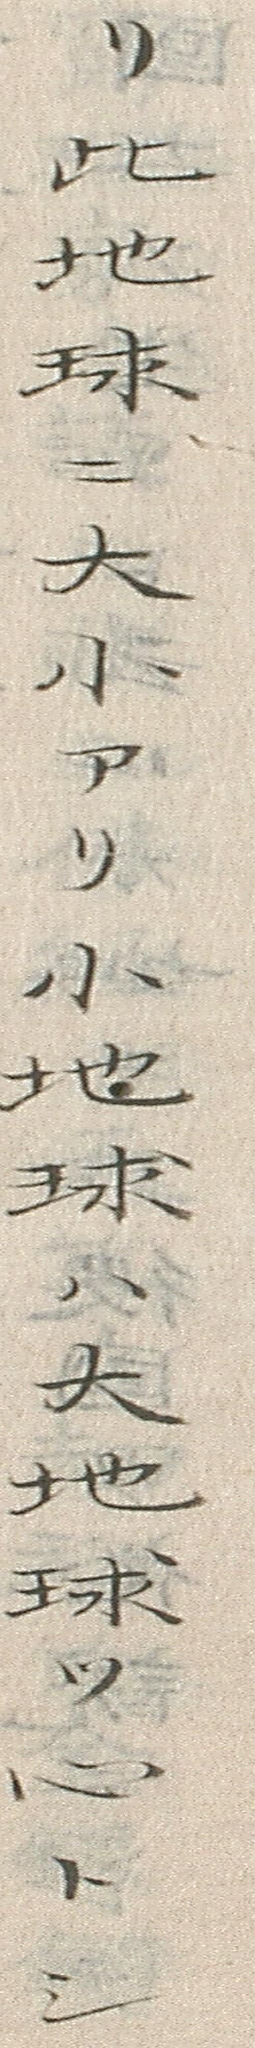リ此地球ニ大小アリ小地球ハ大地球ツ心トシ
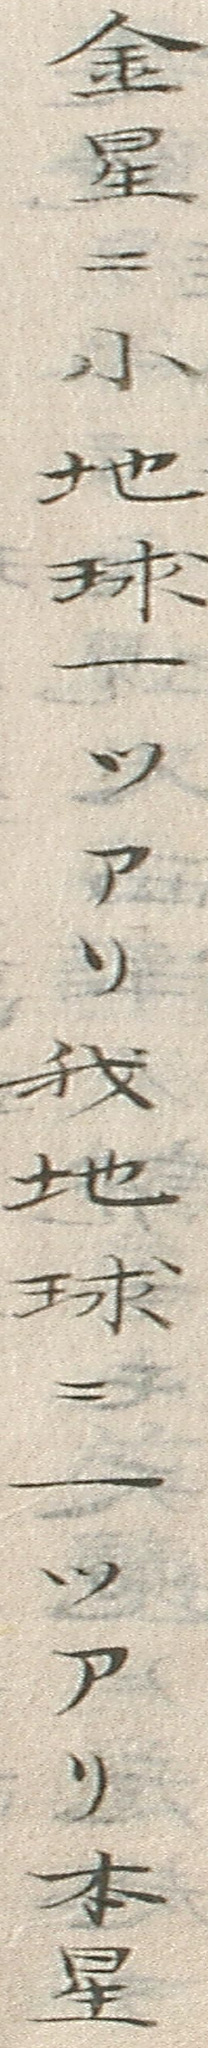金星ニ小地球一ツアリ我地球ニ一ツアリ本星
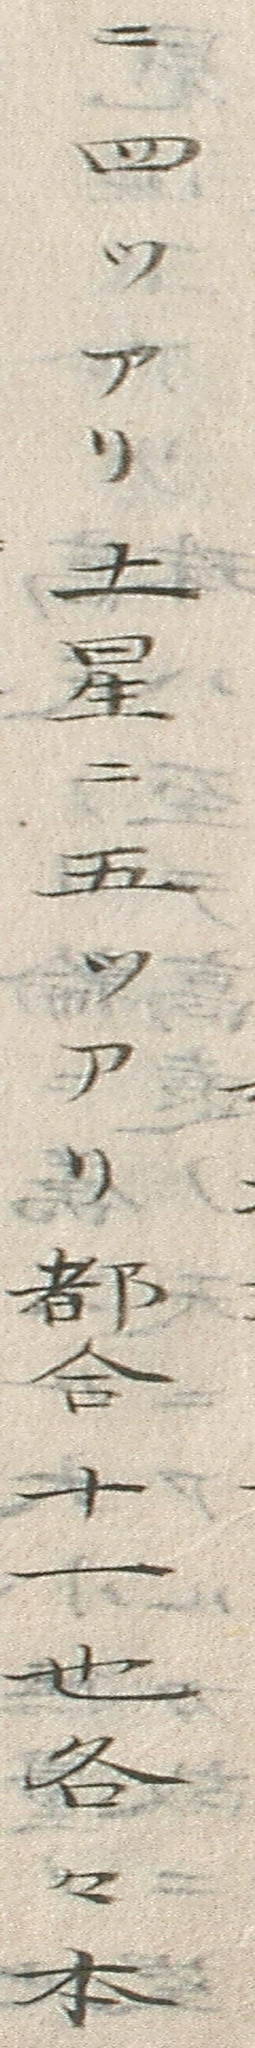ニ四ツアリ土星ニ五ツアリ都合十一也各々本
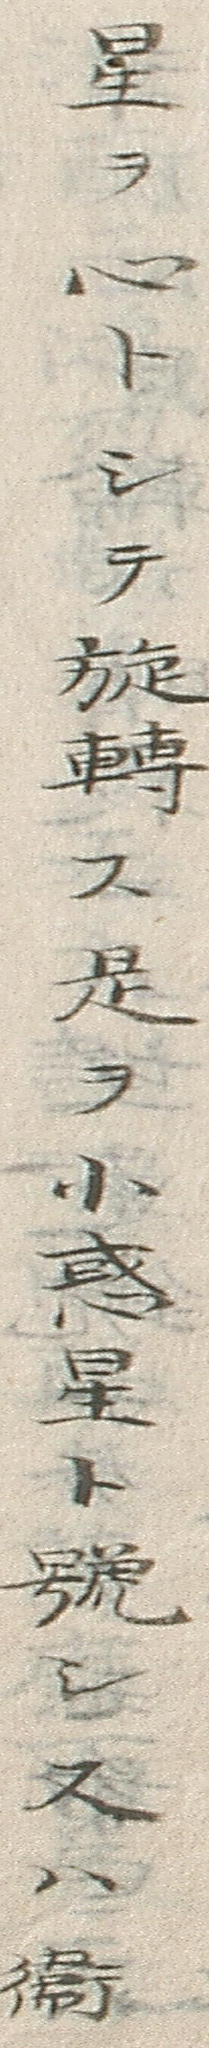星ヲ心トシテ旋転ス是ヲ小惑星ト号シ又ハ衛
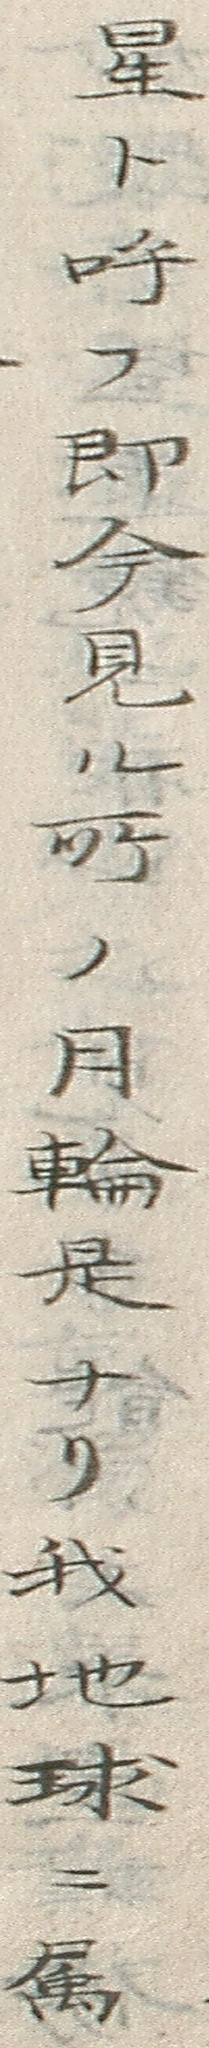星ト呼フ即今見ル所ノ月輪是ナリ我地球ニ属
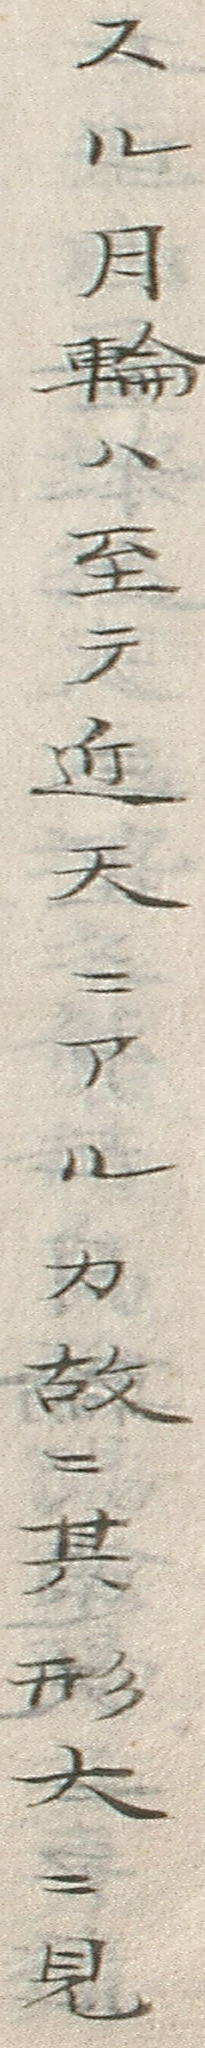スル月輪ハ至テ近天ニアルカ故ニ其形大ニ見

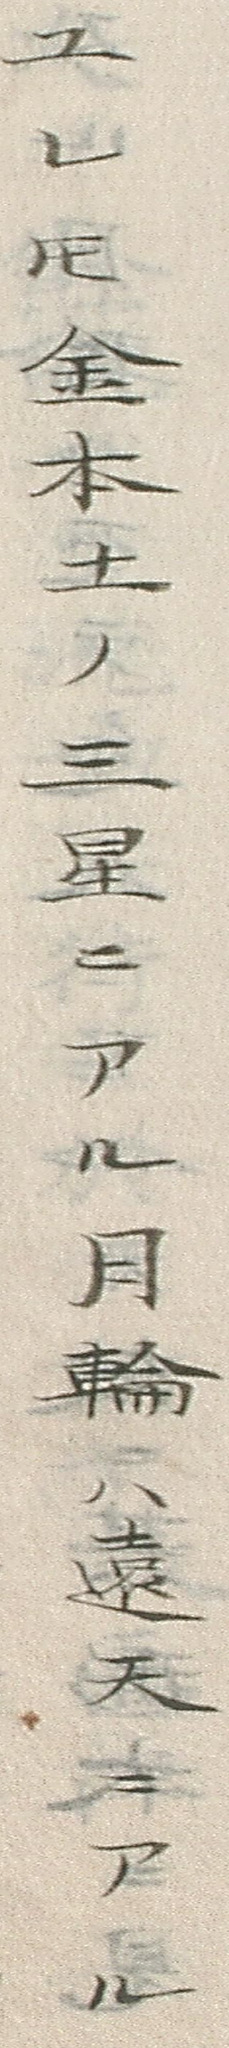ユレトモ金本土ノ三星ニアル月輪ハ遠天ニアル
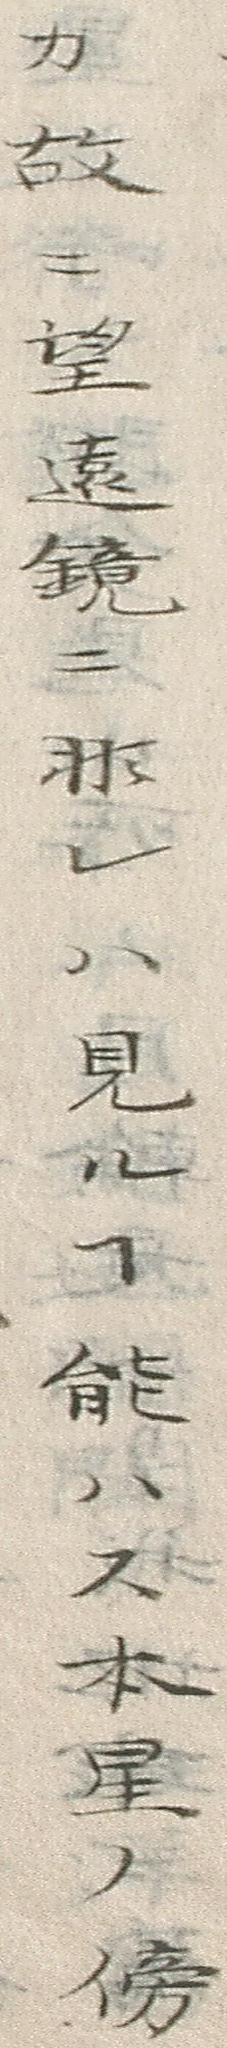カ故ニ望遠鏡ニ非レハ見ルコト能ハス本星ノ傍
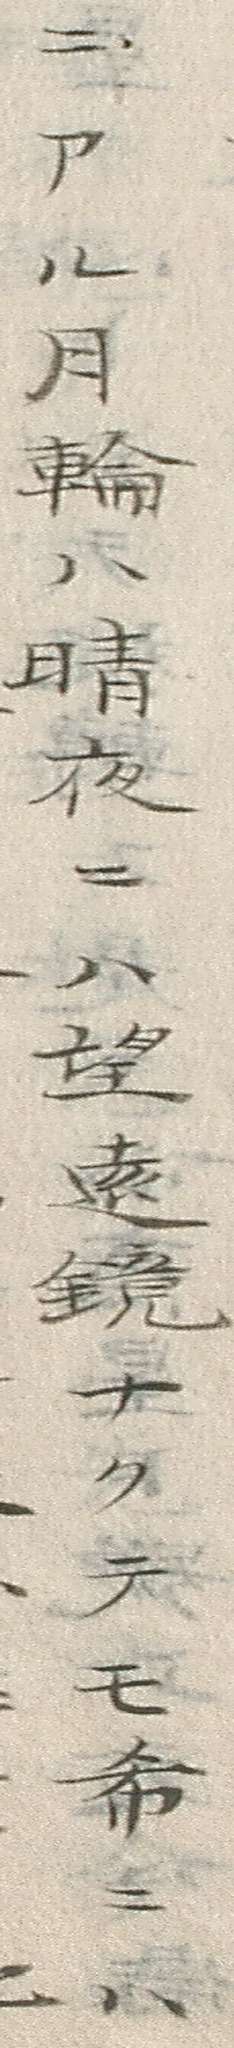ニアル月輪ハ晴夜ニハ望遠鏡ナクテモ希ニハ
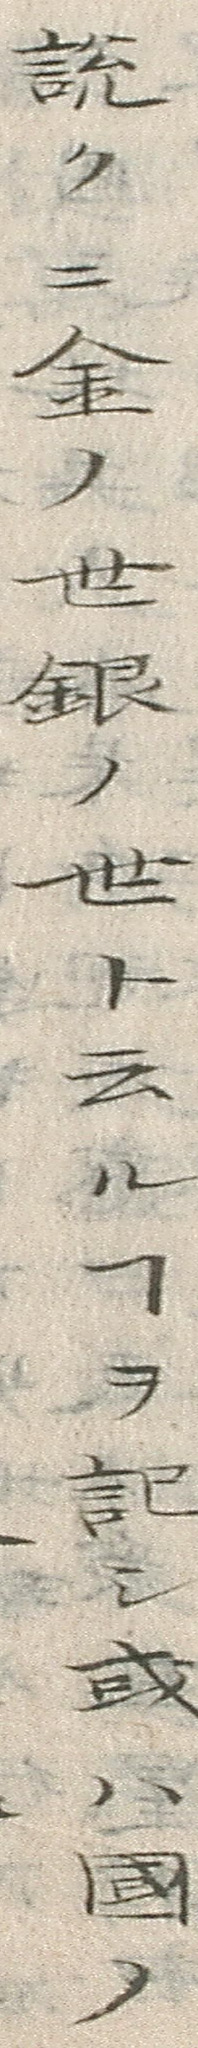説クニ金ノ世銀ノ世ト云ルコトヲ記シ或ハ国ノ
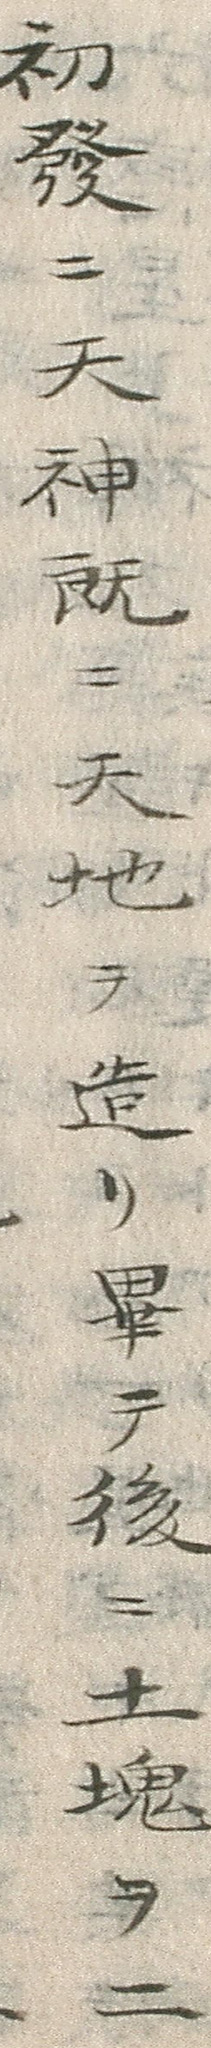初発ニ天神既ニ天地ヲ造リ畢テ後ニ土塊ヲ二
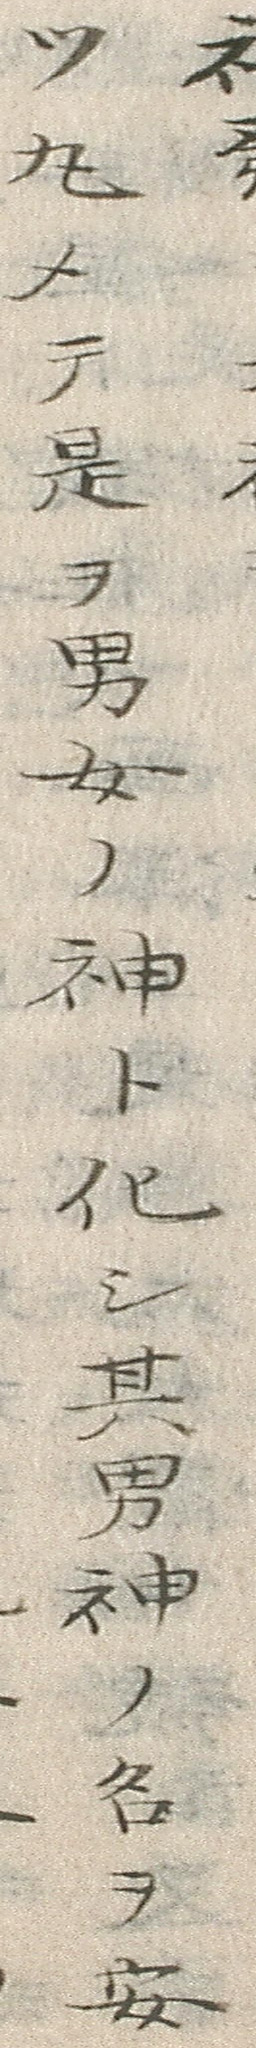ツ丸メテ是ヲ男女ノ神ト化シ其男神ノ名ヲ安
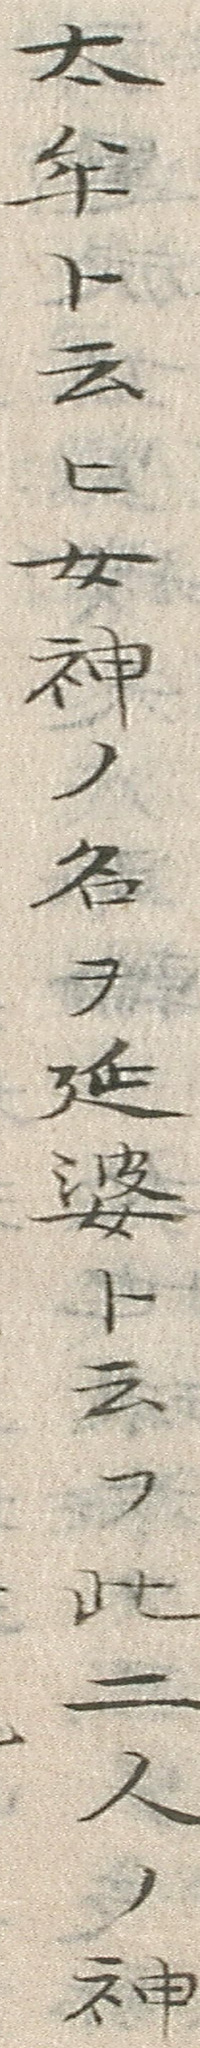太牟ト云ヒ女神ノ名ヲ延婆ト云フ此二人ノ神
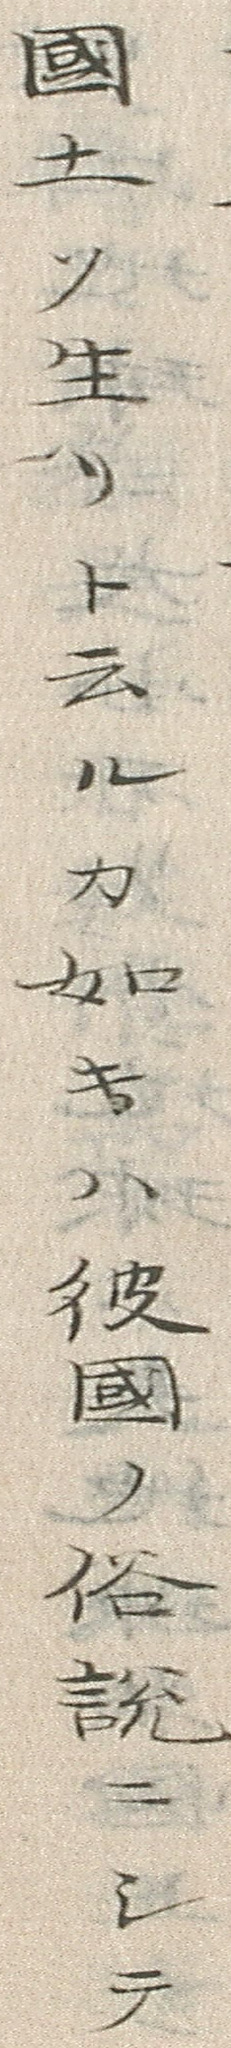国土ノ生リト云ルカ如キハ彼国ノ俗説ニシテ
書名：天學略名目羽翼　全
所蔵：東京大学地震研究所図書室 Earthquake Research Institute Library, The University of Tokyo, JAPAN
